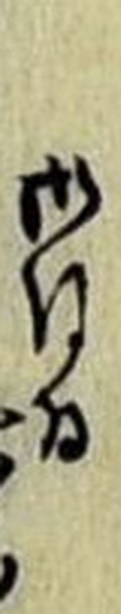御目付
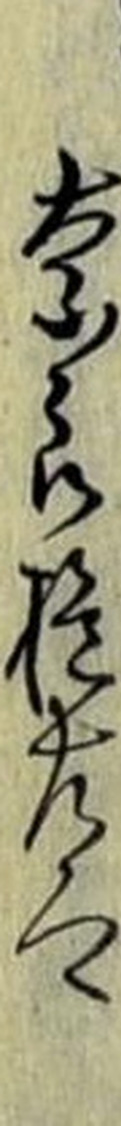奈良権左衛門へ
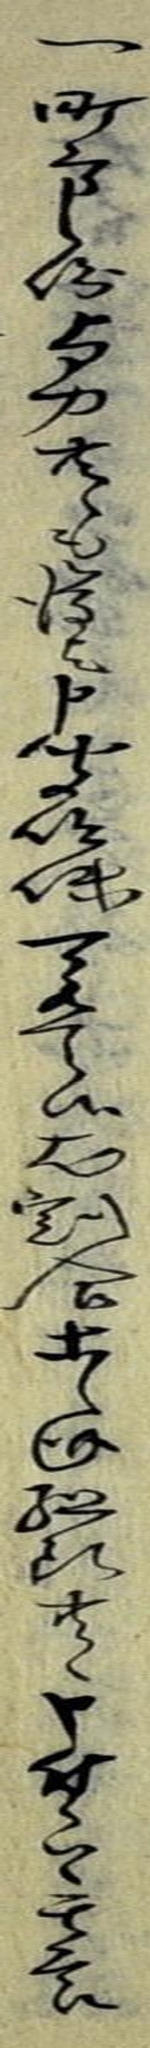一町方之儀与力共へも得と申聞吟味可有之候尤割合等之趣組頭共へ申付候はゝ其節
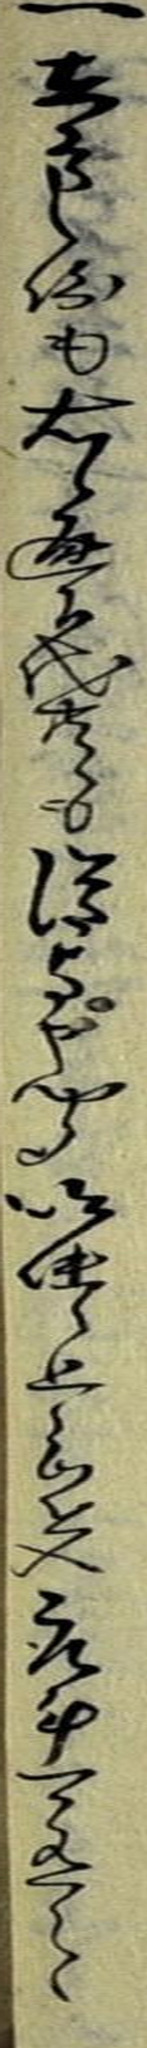一在方之儀も右之通下代共へも得と申聞吟味之上念を入取斗可有之候
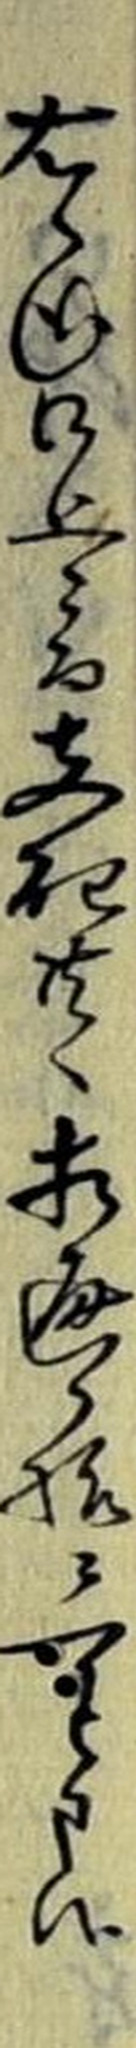右之趣口上に而支配共へ相通候様に可被申候
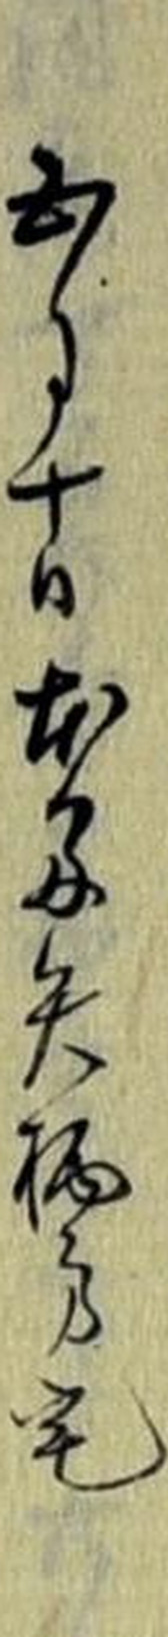五月十日本多矢柄方宅
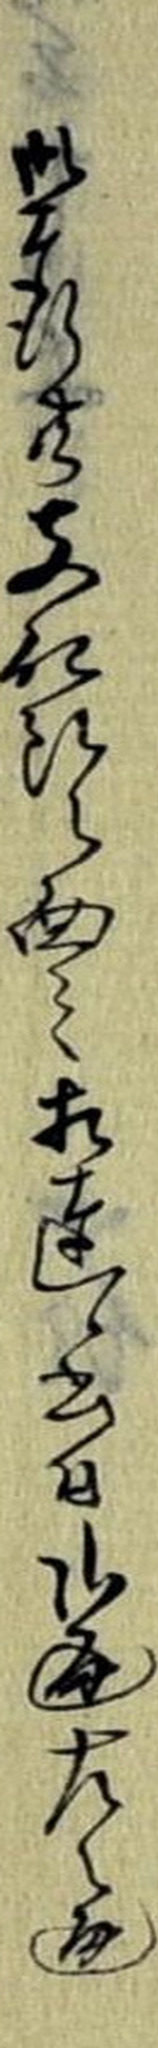御奉行共支配頭之面々へ相達候書付弐通左之通
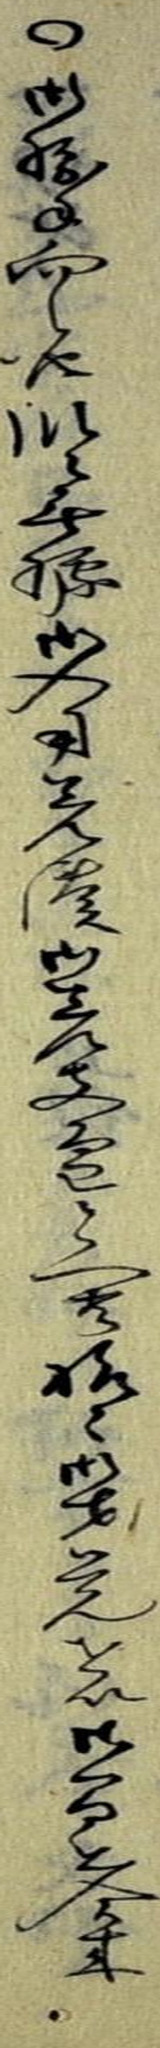〇御勝手向之儀段々無拠御入用差続御差支而已に候へ共様々御才覚を以御間を合来
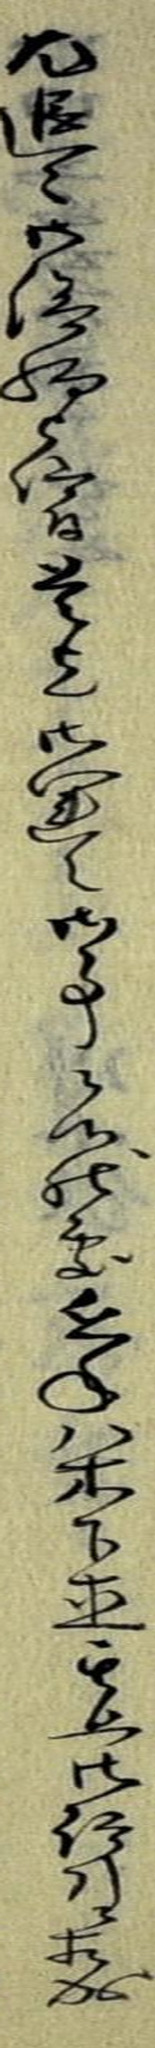尤追々御倹約被仰付是迄御運之御事に候然処近年八木下直其上御跡引に相成
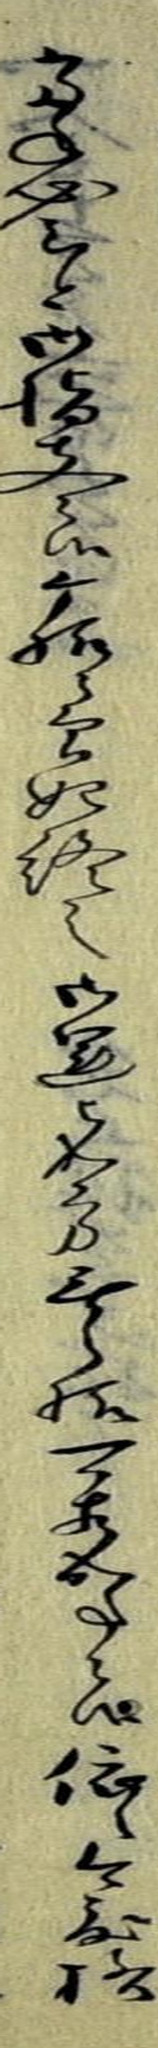当年必至と御指支に候ヶ様に而は始終之御運被成方無之様可相成事に候依之今度格
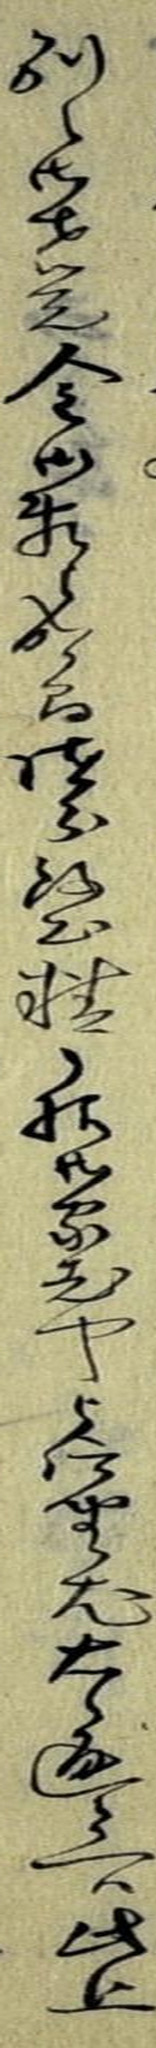別之御才覚金御頼被成候間随分致出精候様御家老中被仰聞候尤右之通に候へは此上
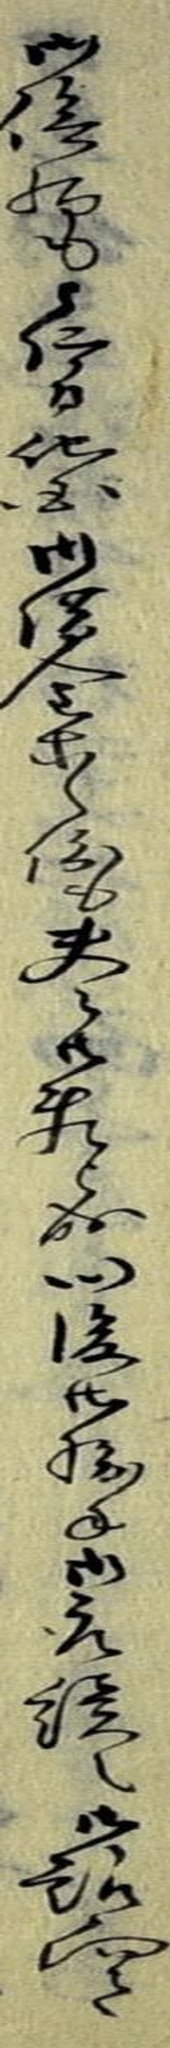御倹約も被仰付他国御借金等之儀も夫々御頼被成以後御勝手御取続之御趣向に候
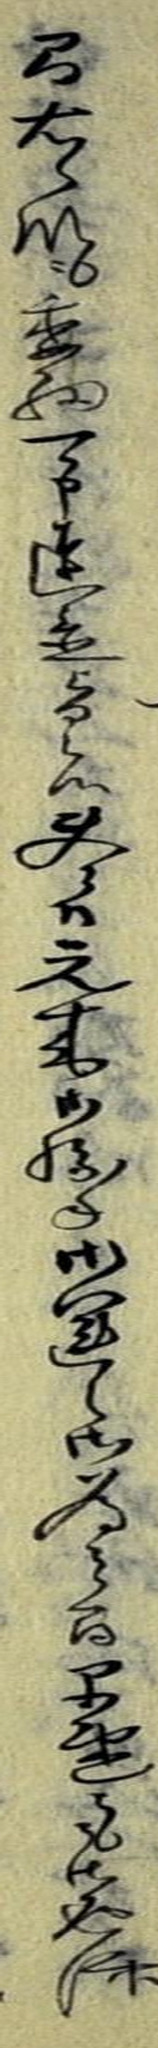間右之段も委細可申達置旨に候夫に付元来御勝手御運之御為に候間早速にも御返済
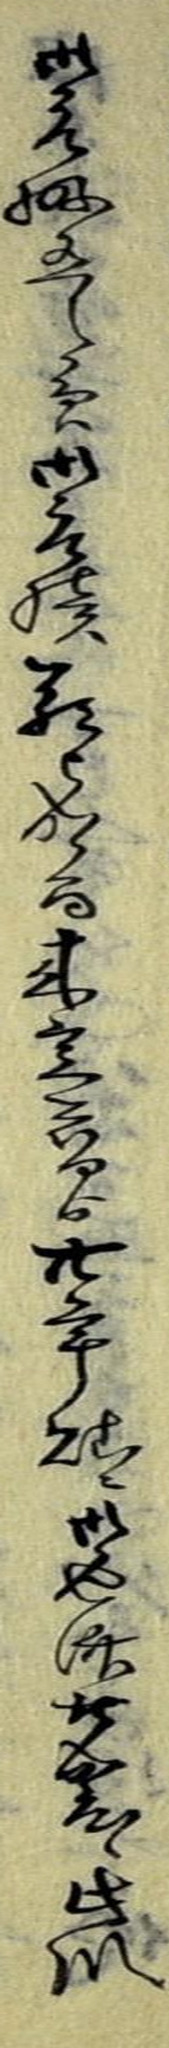御取扱有之候而は御取続難被成候間来亥暮ゟ廿年賦に御返済被成度候此段
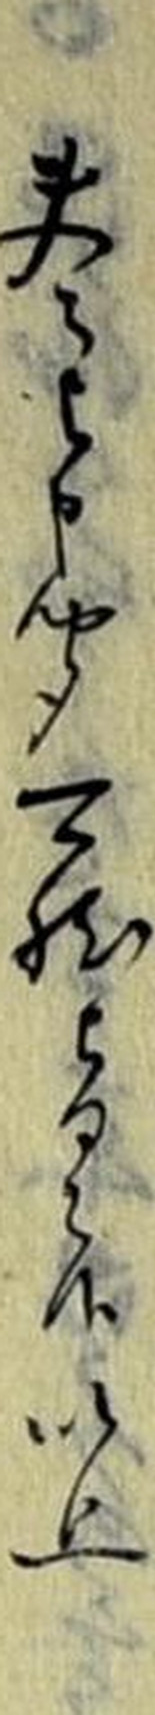夫々被申聞可然旨に候以上
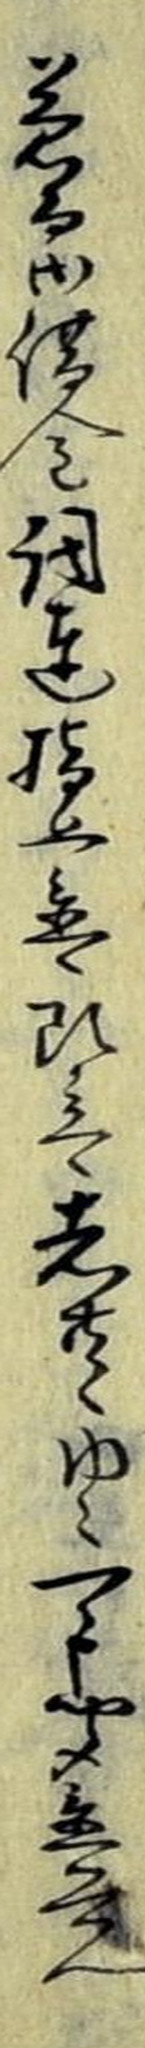兼而御借金調達指上置候頭立之者共へ内々可申聞置覚
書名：命令之部 二
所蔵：福井県文書館 Fukui Prefectural Archives
